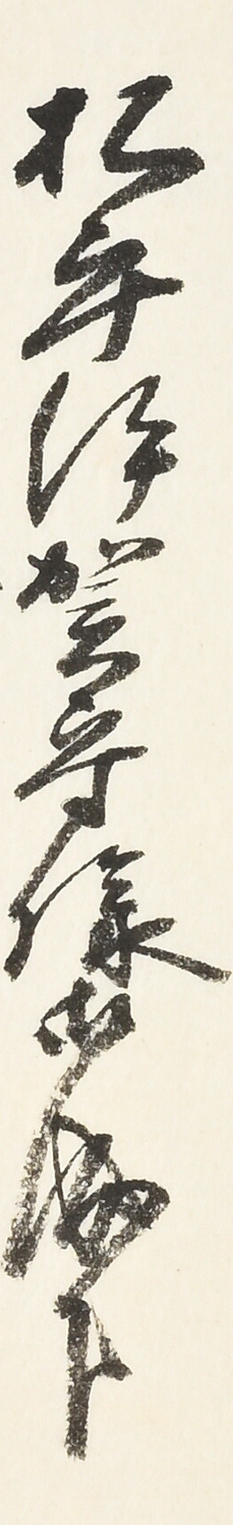松平伊賀守様御城下
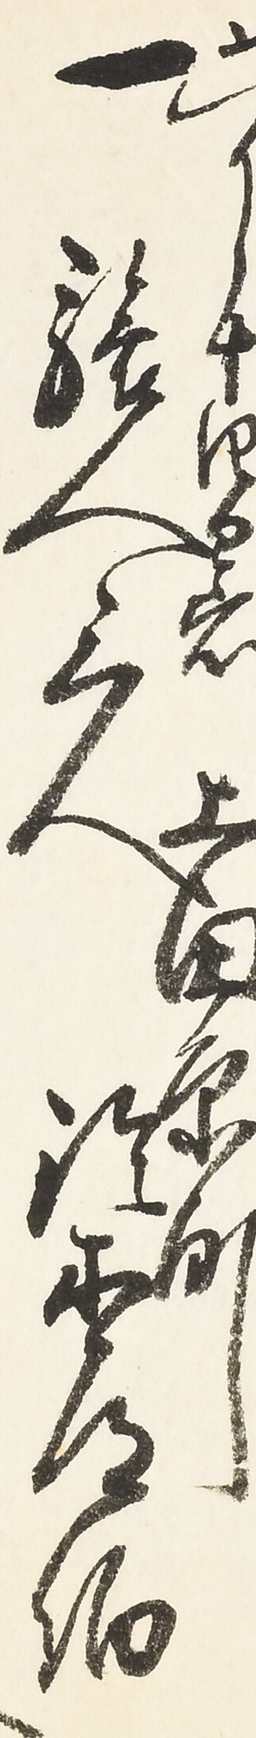一旅人三人鈴木道伯
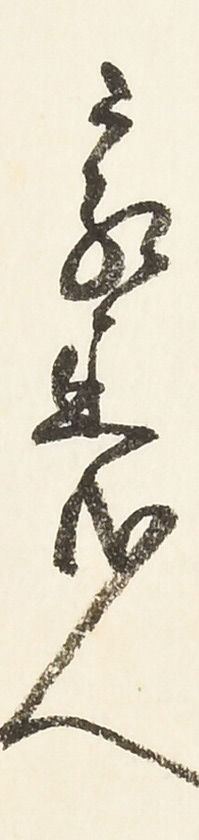家来弐人
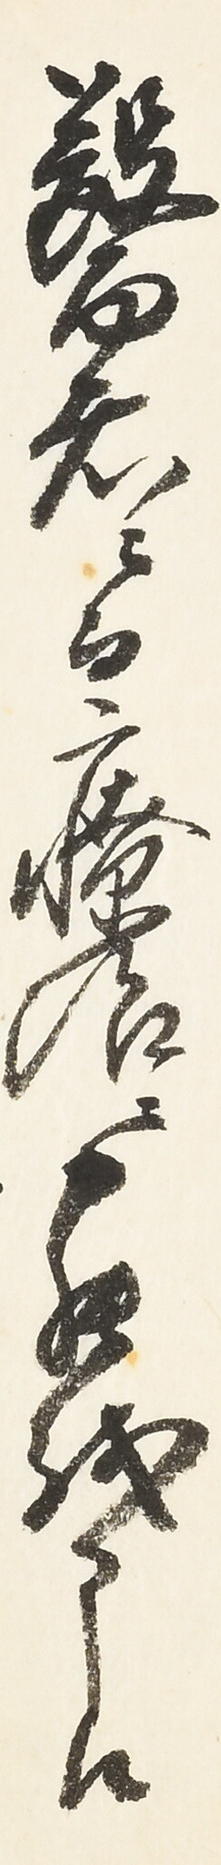医者ニ而療治ニ罷越申候
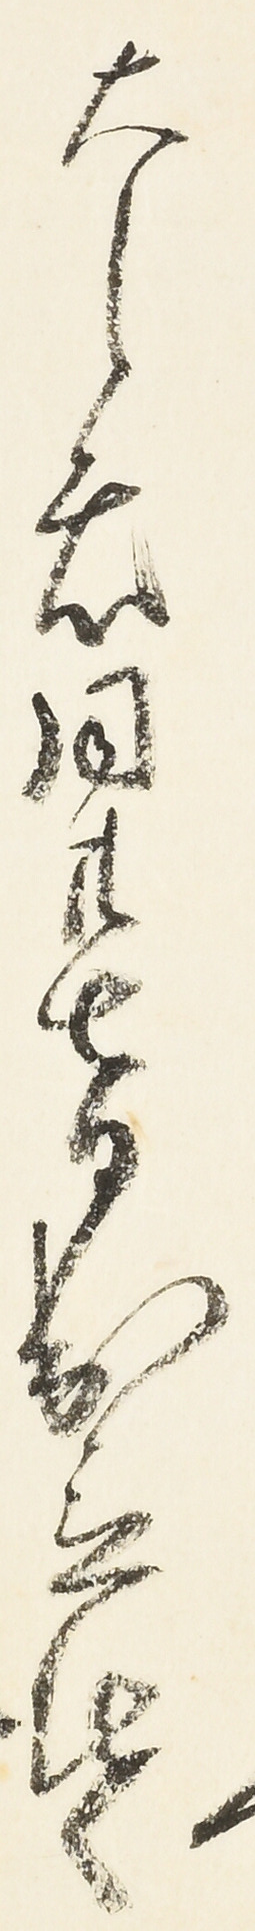右之者同廿七日出立仕候
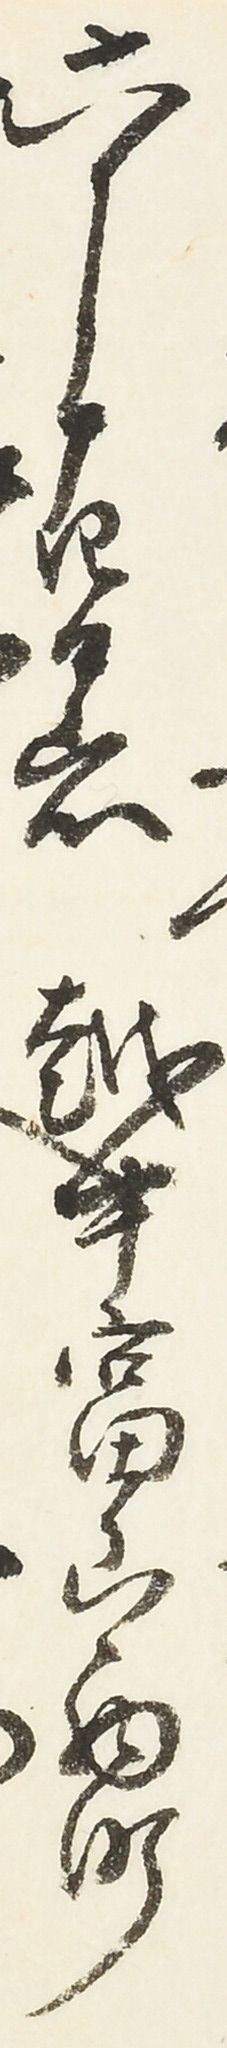六月十四日着越中富山西町
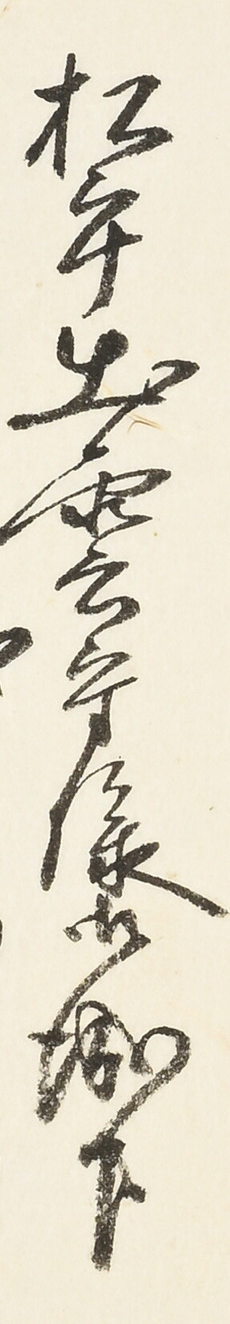松平出雲守様御城下
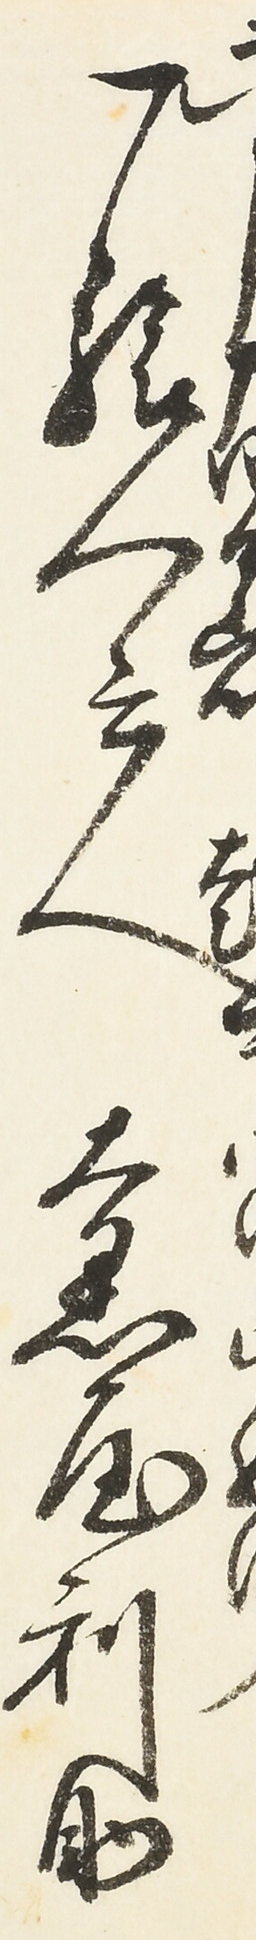一旅人壱人大黒屋利助
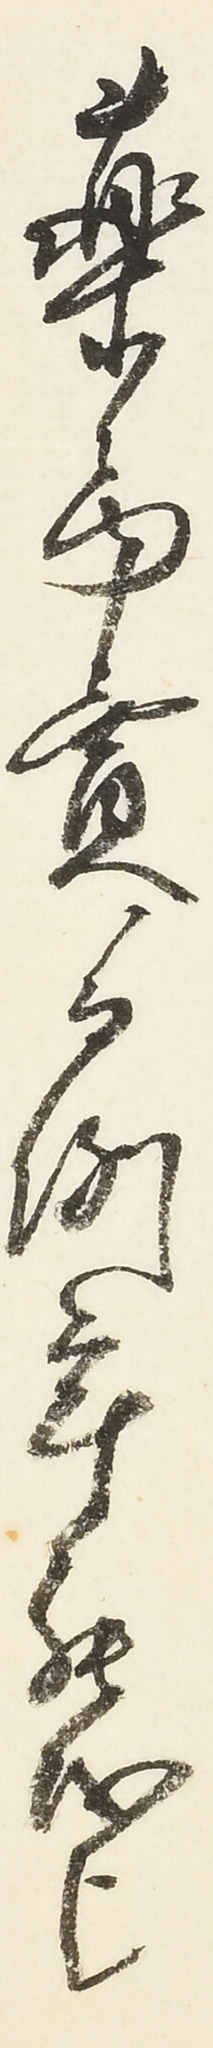薬商売ニ而例年罷越申候
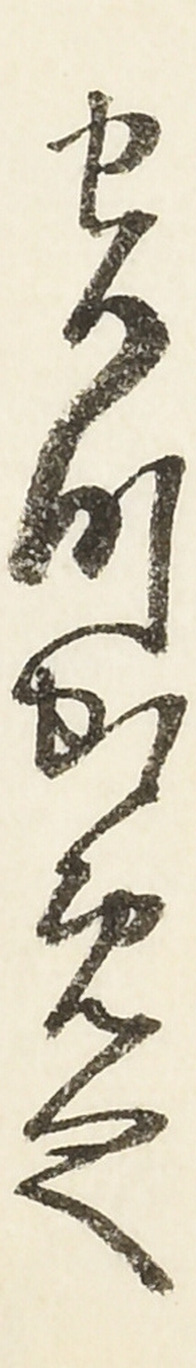せり町かめや
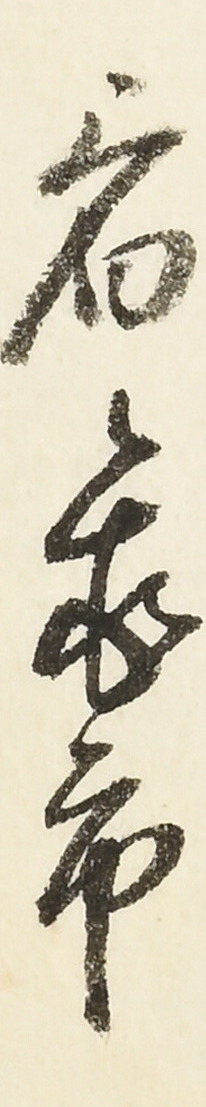宿亀市
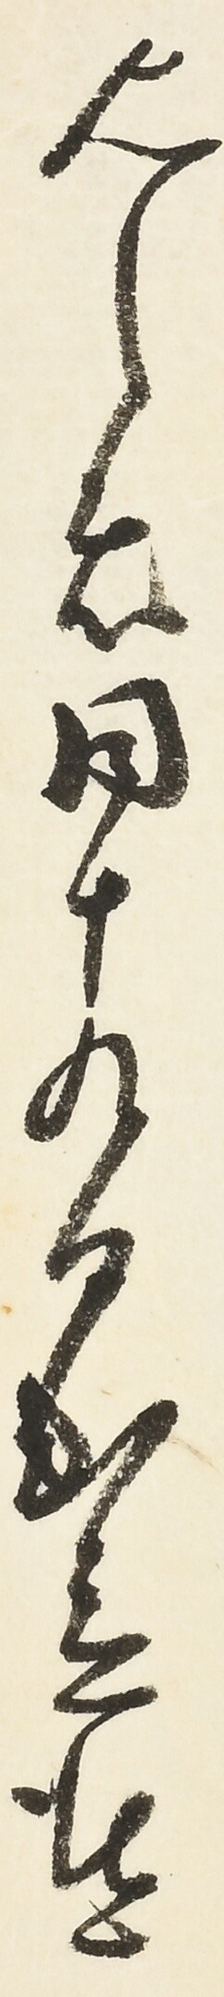右之者同十九日出立仕候

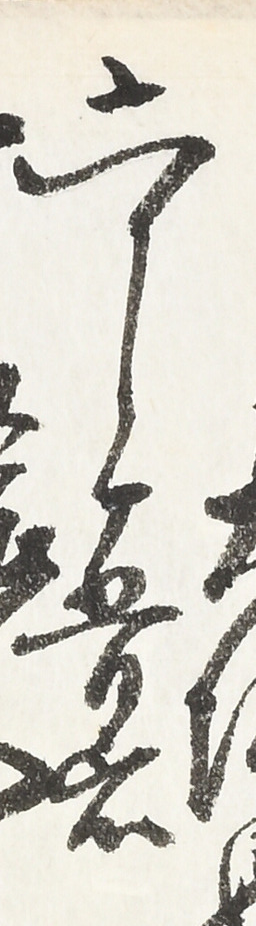六月十五日着
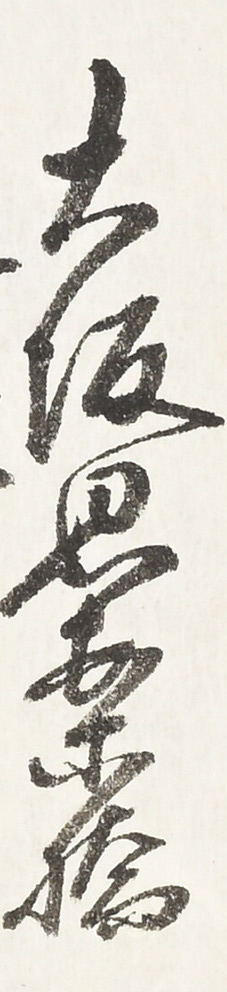大坂思案橋
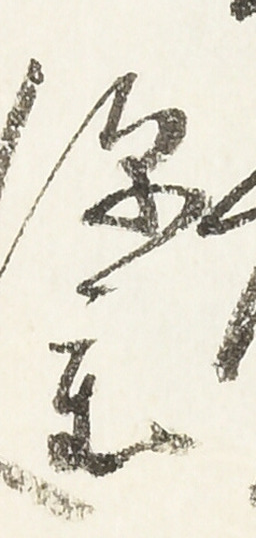深兵衛
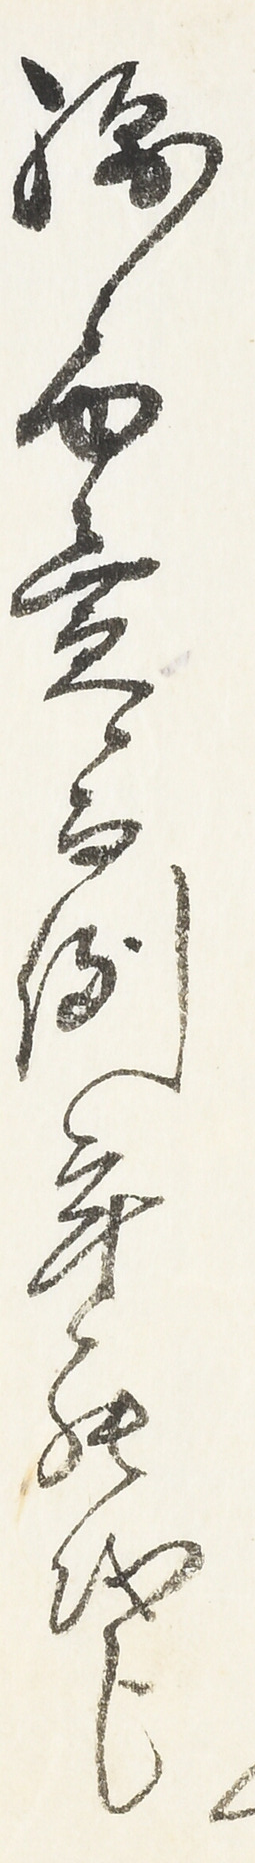綿商売ニ而例年罷越申候
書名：町中旅人泊控帳
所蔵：伊那市立高遠町図書館・合同会社AMANE
